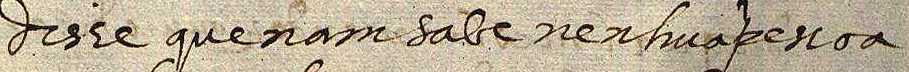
disse que nam sabe nenhuā pessoa
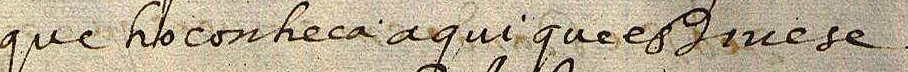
que ho conheca aqui que estiuese
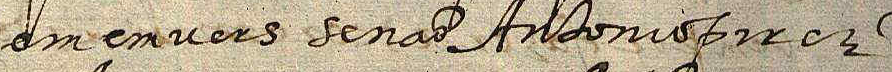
em emuers senaõ Antonio pirez
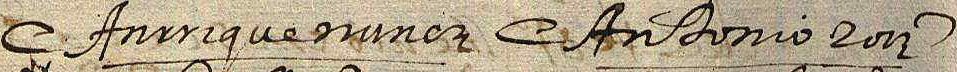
e Anrrique nunez e Antonio roiz̄
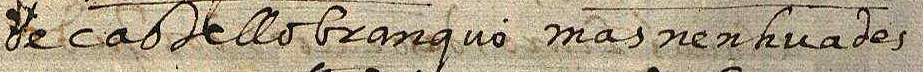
de castello branquo mas nenhua des
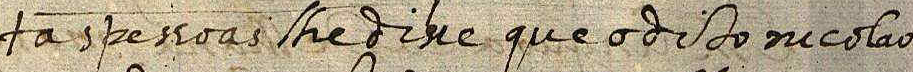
tas pessoas lhe disse que o dito nicolao
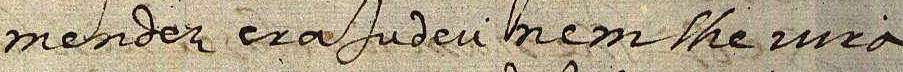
mendez era Judeu nem lhe uira
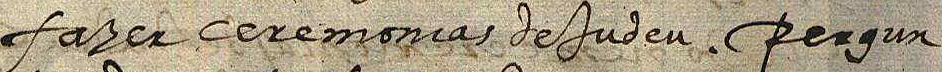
fazer ceremonias de Judeu. pergun
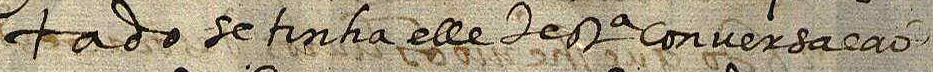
tado se tinha elle testa conuersação
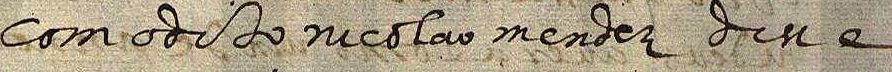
com o dito nicolao mendez disse
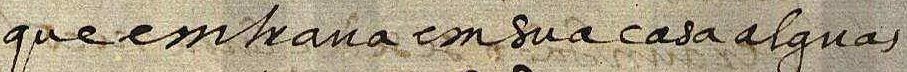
que emtraua em sua casa alguas
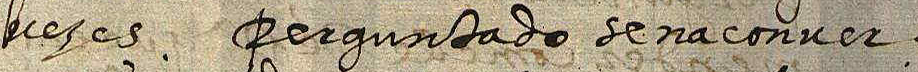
uezes. Perguntado se na conuer
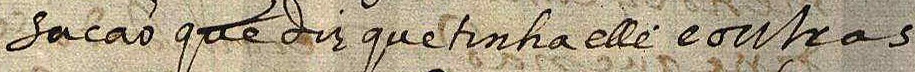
sacaõ que diz que tinha elle e outras
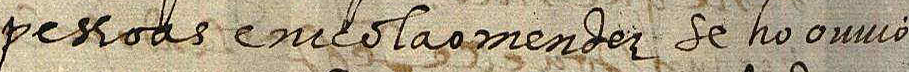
pessoas e nicolao mendez se ho ouuiu
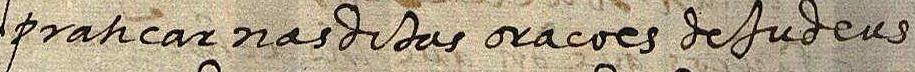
praticar nas ditas oracoes de Judeus
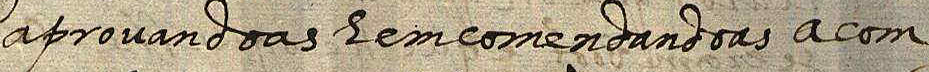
aprouandoas e emcomendandoas a com
